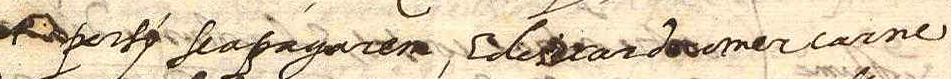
_ per sy se apagarem, E deixar de comer carne
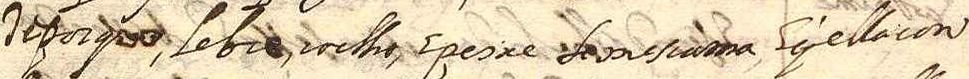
de porq__, Lebre, coelho, E peixe sem escama, E q̄ ella con
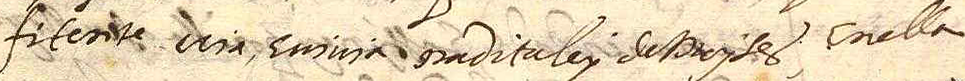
fitente cria, E uiuia na dita ley de Moyses, E nella
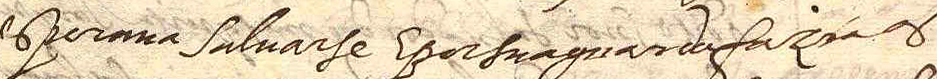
esperaua saluarse E por sua guarda fazia as
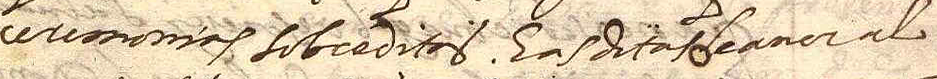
ceremonias sobreditas. E as ditas leanor al
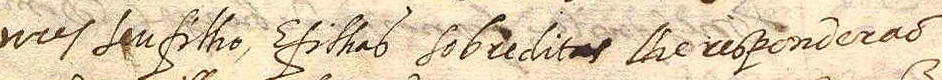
ures seu filho, E filhas sobreditas lhe responderaõ
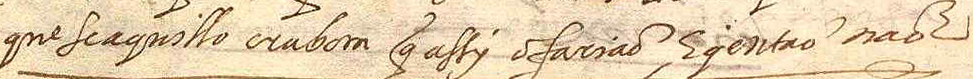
que se aquillo era bom q̄ assy o faziaõ, E q̄ entaõ naõ
